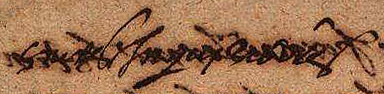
snores̄ Inqujzidores
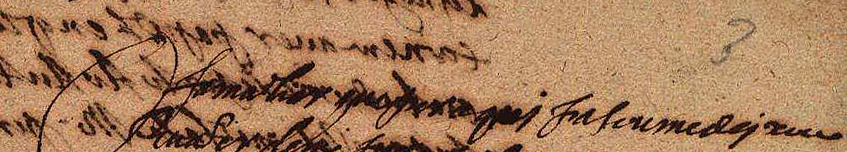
O famaliar que por aquj pasou me dejxou
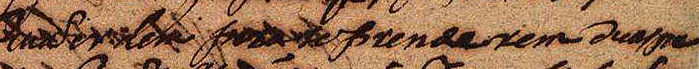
huā ordem para se prenderem duas pe
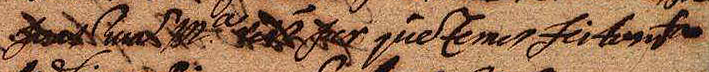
soas huā m.a roiz̄ por qūe temos feito mta
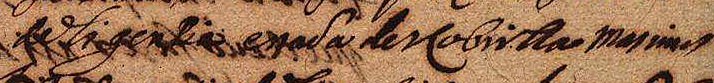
deligensia e naõ a desCobri lla mas imos
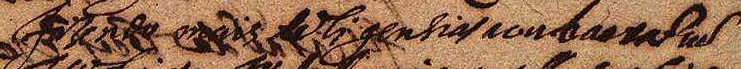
fazendo mais deligensias a outra era hū
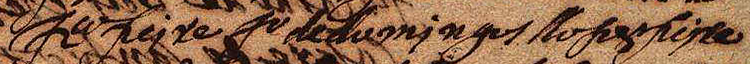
frco frejre fo de domjngos llopes frejre
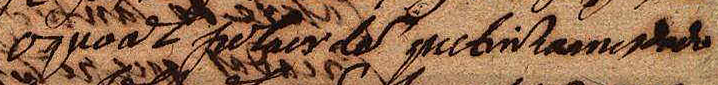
o quoaL pela ordē que tinhamos dado
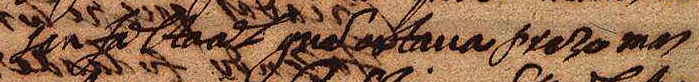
sen falta alguā estaua prezo mas
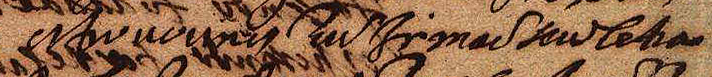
estrouounos hū Jrmaõ seu letra
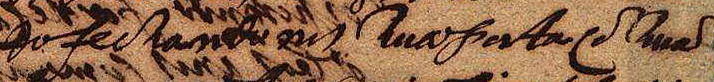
do fechando nos hua porta Cō huā
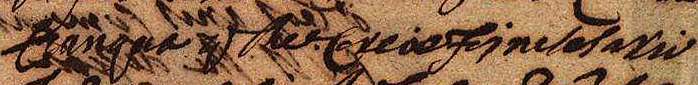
tranqua q̄ lhe Coreo e foj nesesario
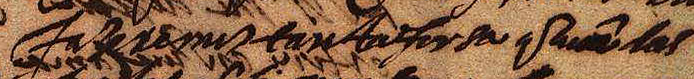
fazeremos tanta forsa q̄ huā das
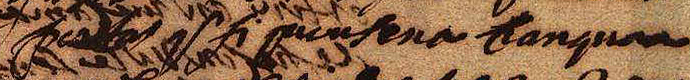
portas q̄ fiquou sen a tranquaa
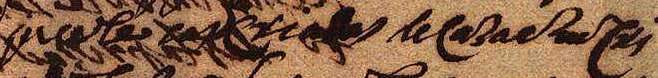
que ele e as Criadas de Caza e hū Cri
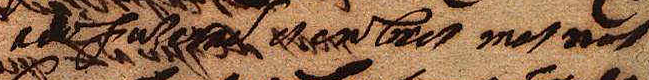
ado puzeraõ os onbros mas nos
